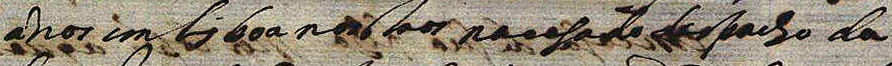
ānos em lisboa nos estaos na casa do despacho da
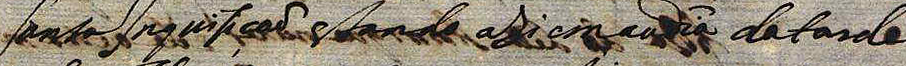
Santa Jnquisiçaõ estando ahi em audiā da tarde
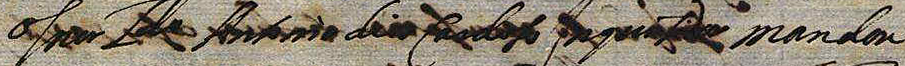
o Snor Ldo Antonio dias Cardoso Jnquisidor mandou
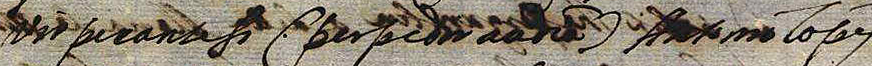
vir perante si (per pedir audiā) Antonio Lopēz
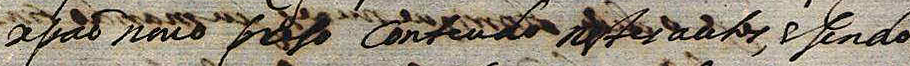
xpaõ nouo preso conteudo nestes autos, e sendo
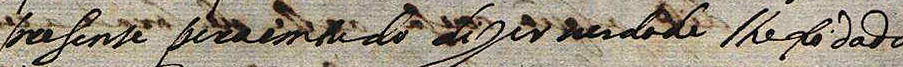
presente pera em tudo dizer uerdade lhe foi dado
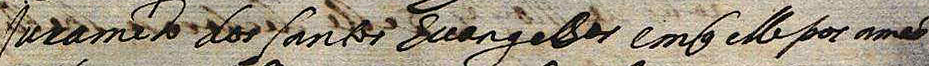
Juramento dos Santos Euangelhos em q̄ elle pos a maõ
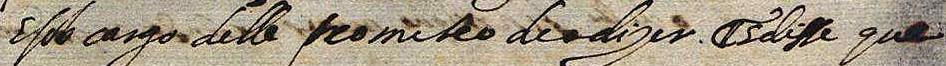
E sob cargo delle prometeo de o dizer ⁋ E disse que
